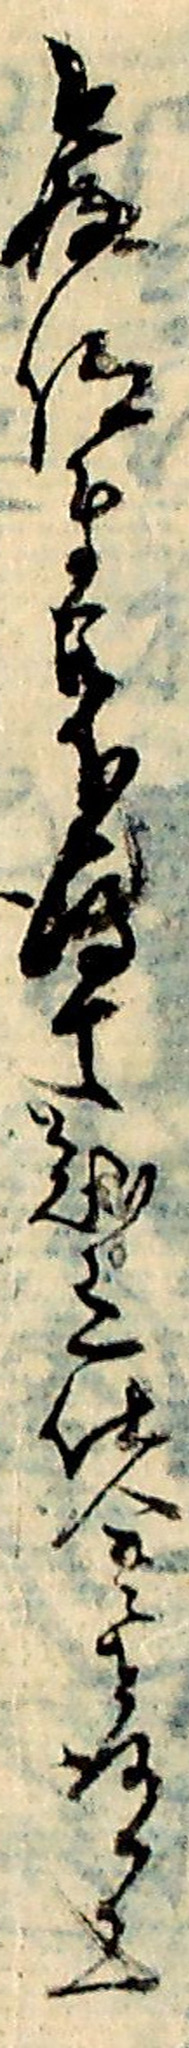被為仰付被下候得は難有仕合に奉存候以上
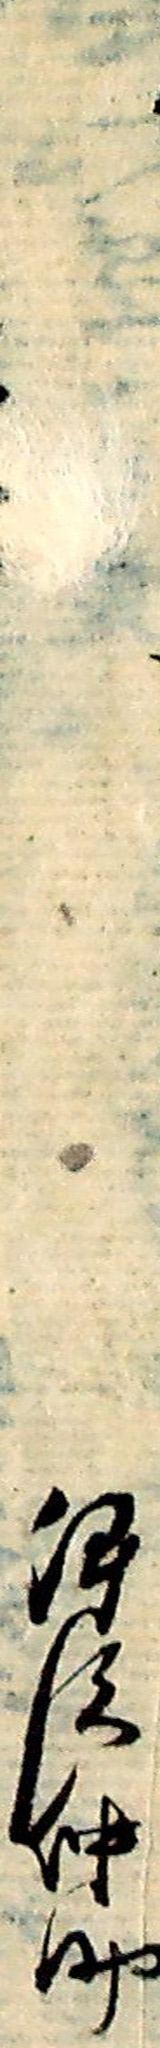伊沢仲助
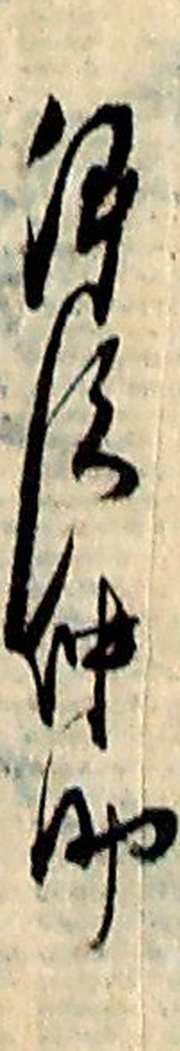伊沢仲助
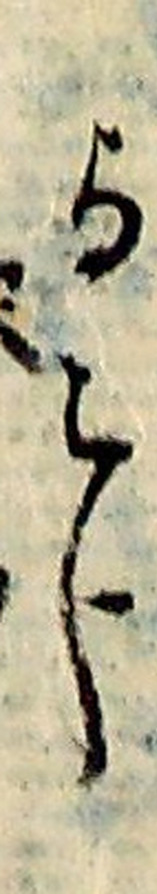与三郎
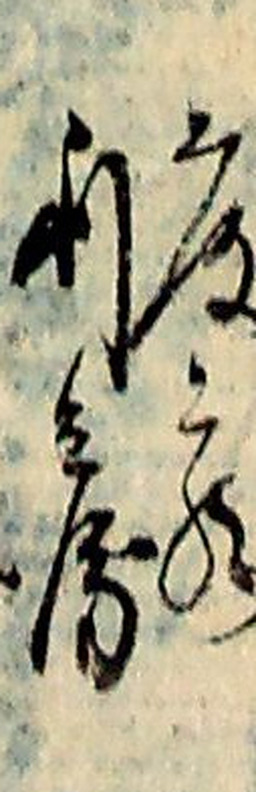利兵衛
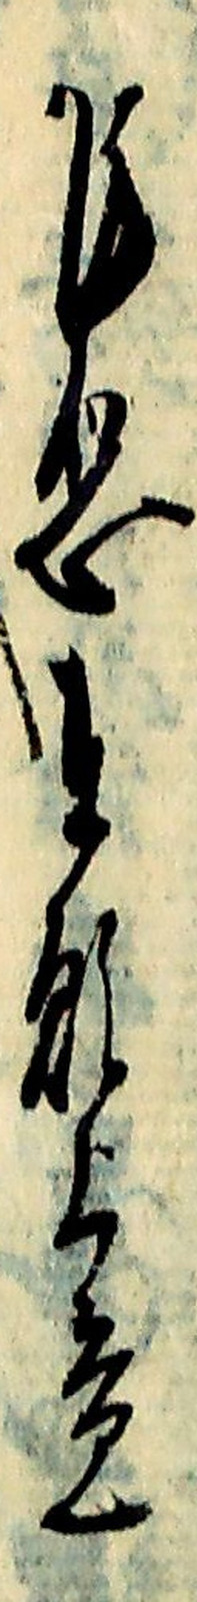乍恐奉願上覚
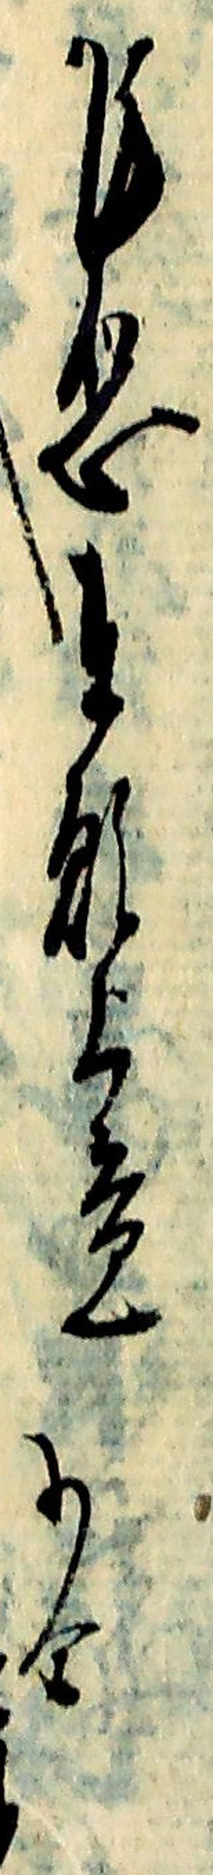乍恐奉願上覚
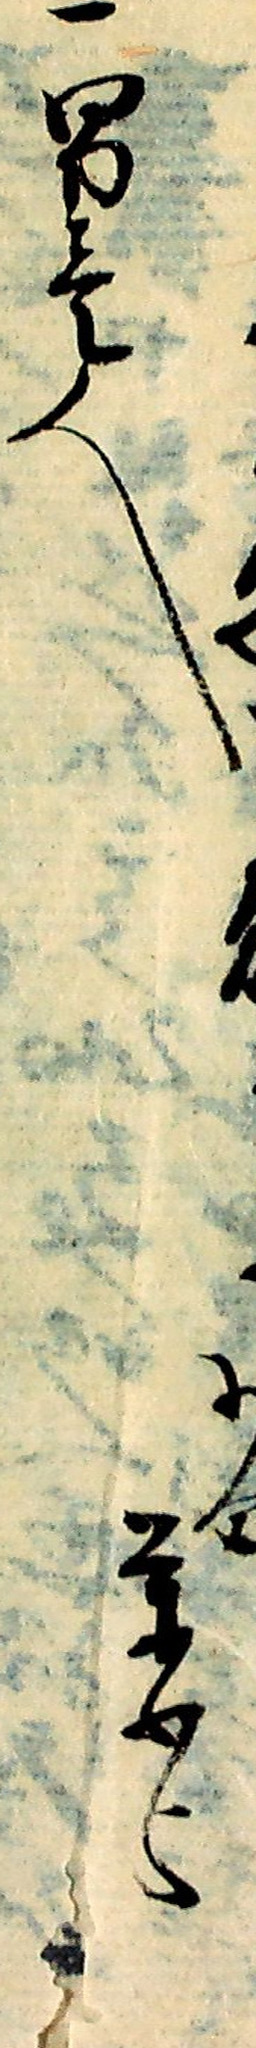一男壱人栄五郎
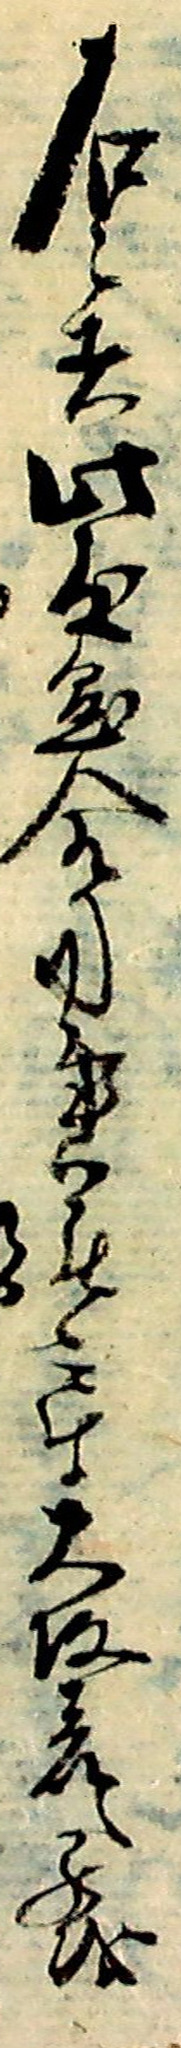右之者此度懸合用事御座候に付大坂表へ罷越
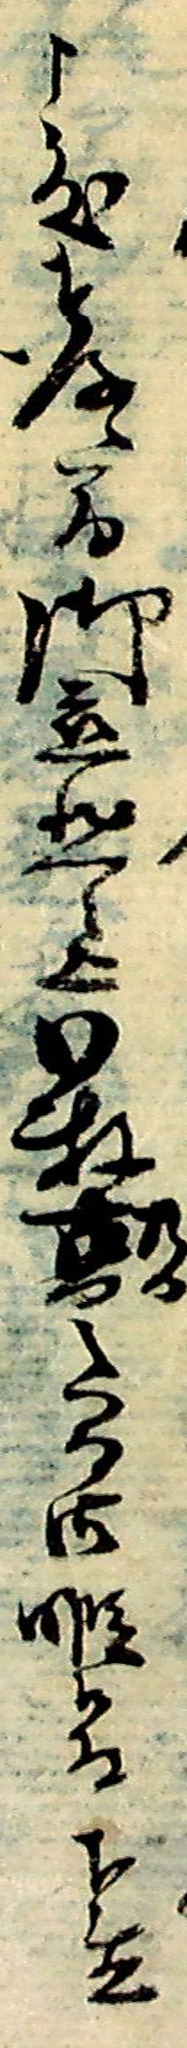申度奉存候間御慈悲之上日数廿日之間御暇被為下置
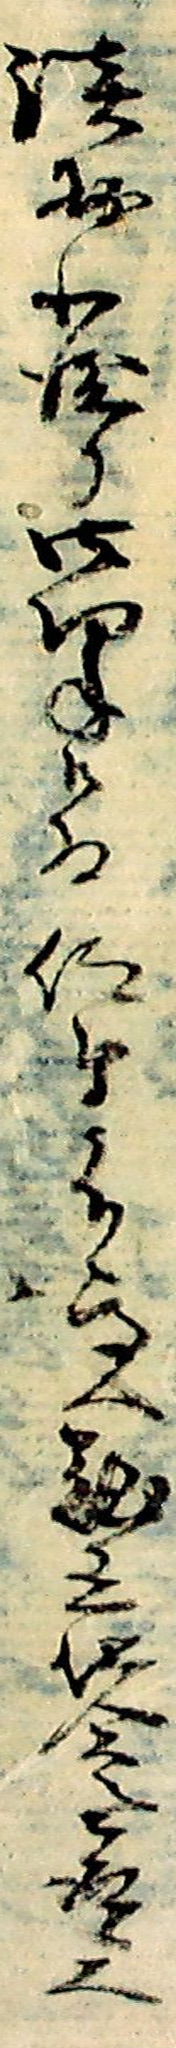淡州小渡り御切手被為仰付被下候得は難有仕合に奉存候以上
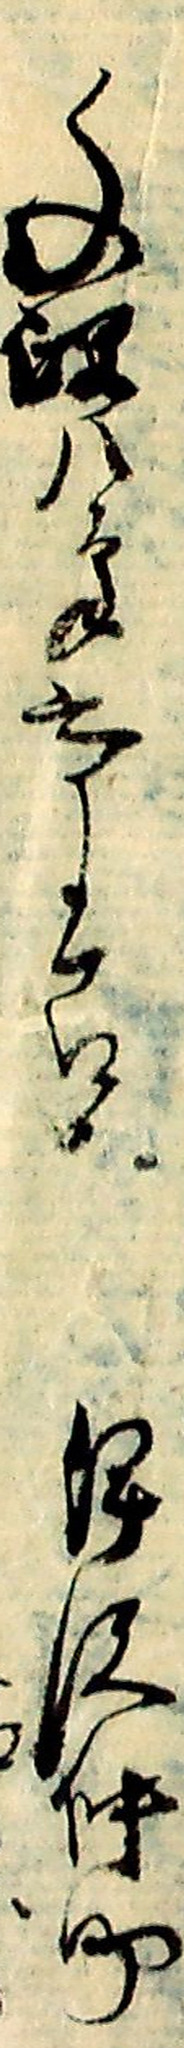文政八酉年六月十四日伊沢仲助
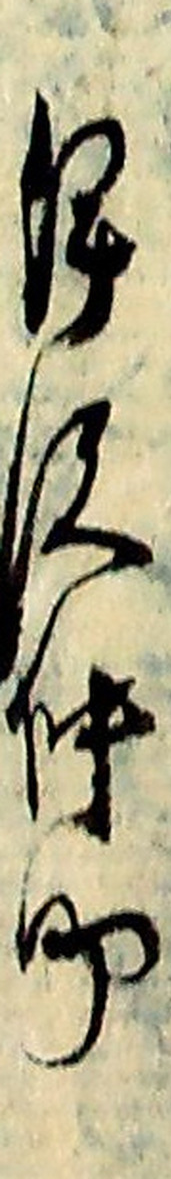伊沢仲助
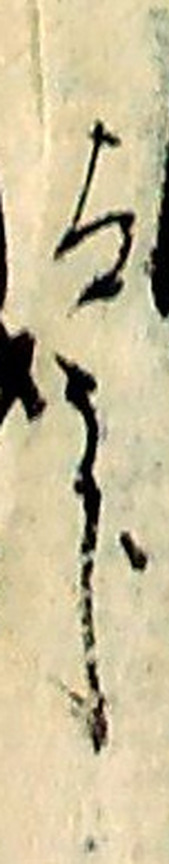与三郎
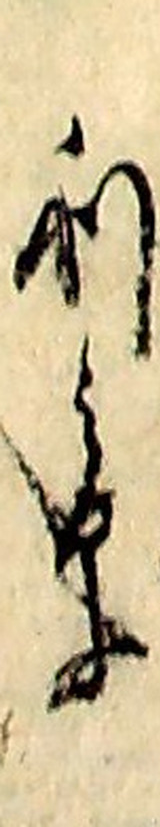利兵衛
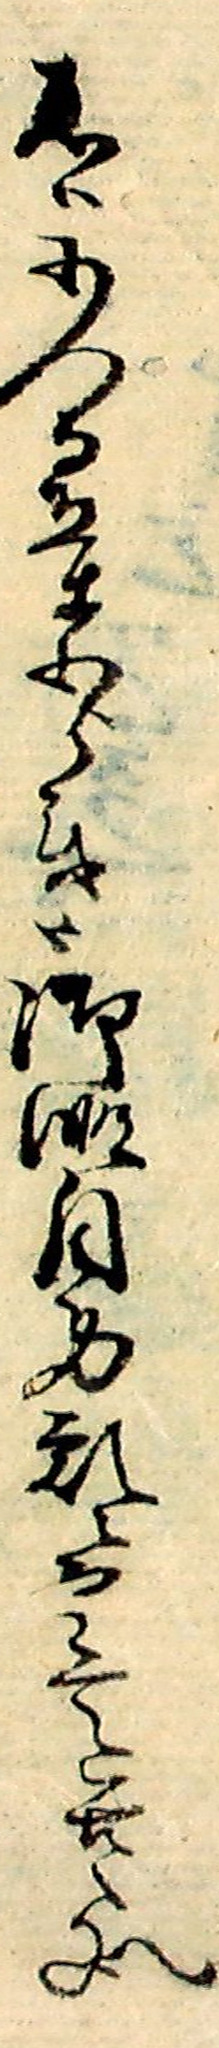右は五人与有木五郎義え御暇自身願にて有之筈之処
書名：諸御願書控(後藤氏壱番）
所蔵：鳴門教育大学 Naruto University of Education
